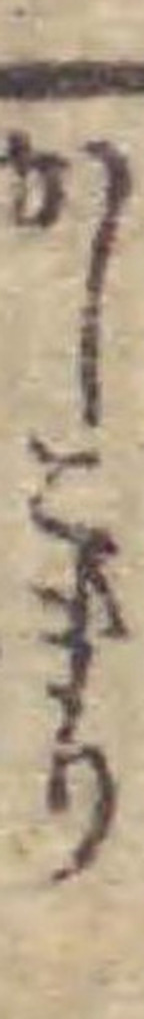かしこまり
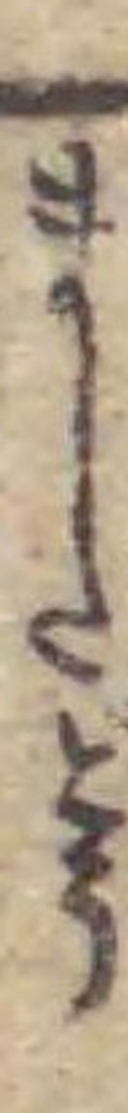ましたどう
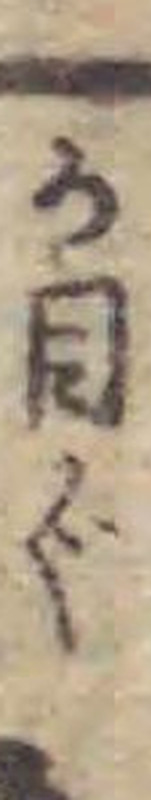か目ぐ
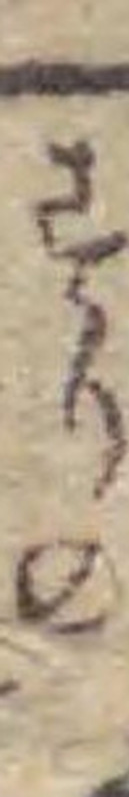すりの
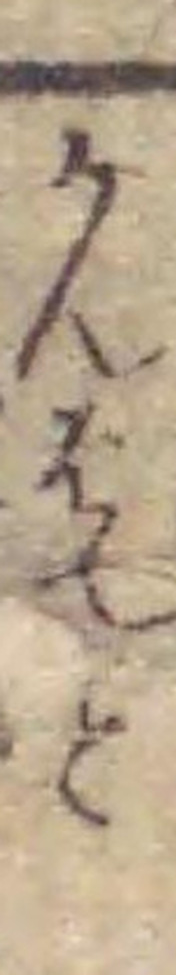かんばんと
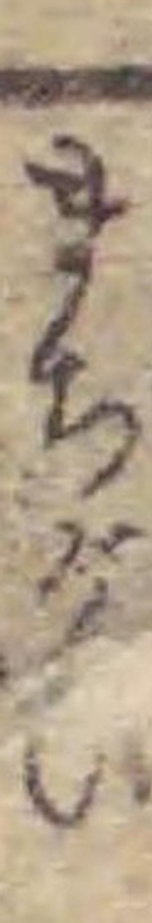まちがい
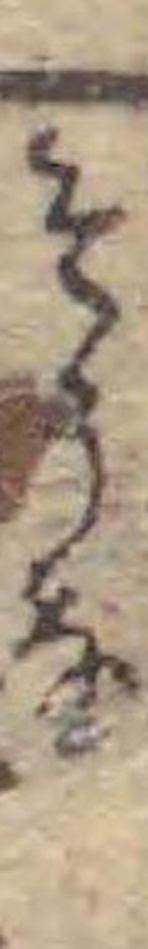そうな
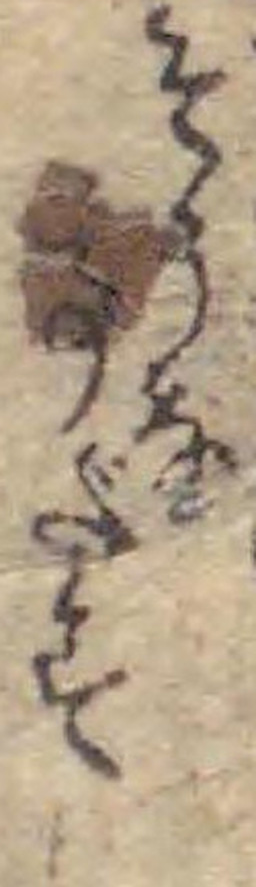事だす
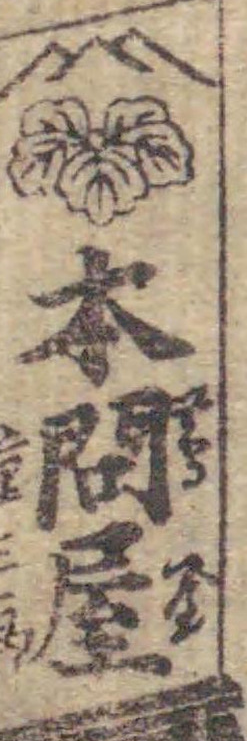本問屋
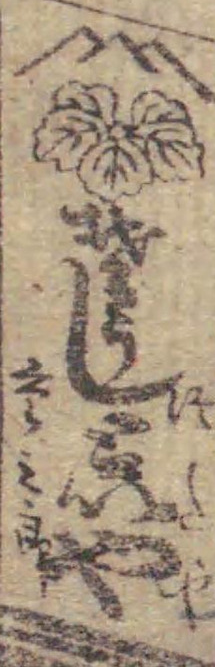そうしといや

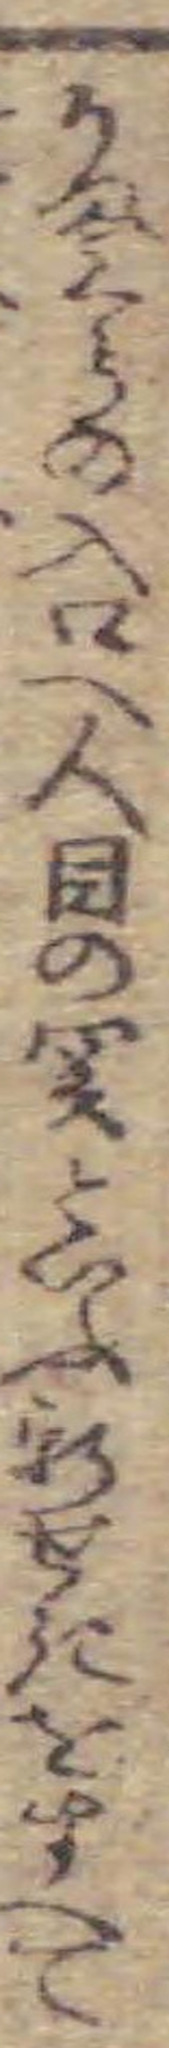かまくらの入口へ人目の関といふ新せきをすへて
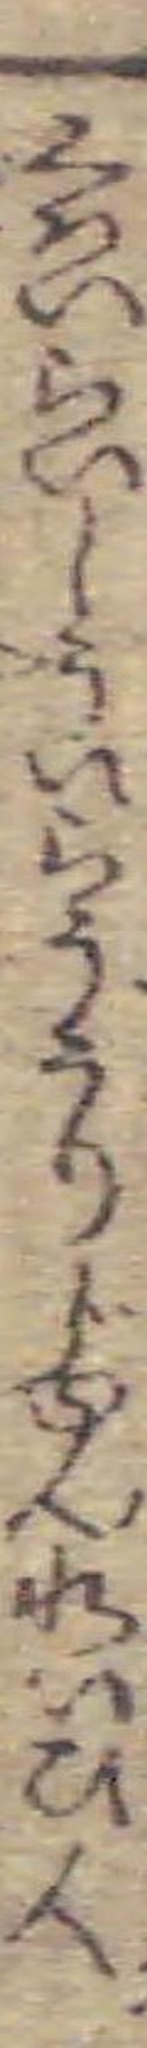くはいらいしういらううりじゆんれいひ人
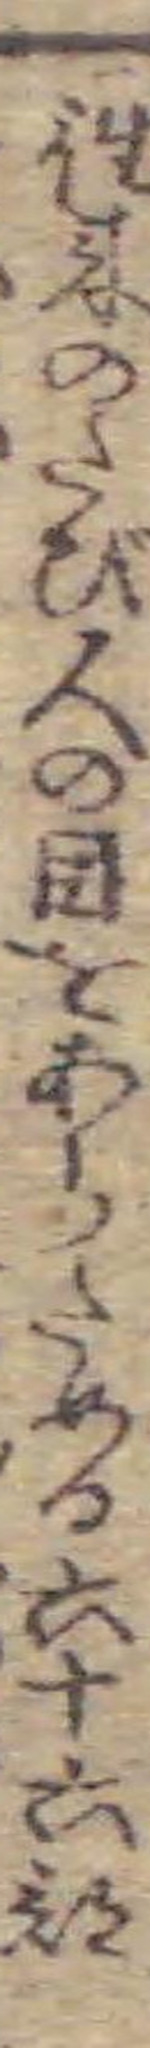往来のたび人の目をあらためる六十六部
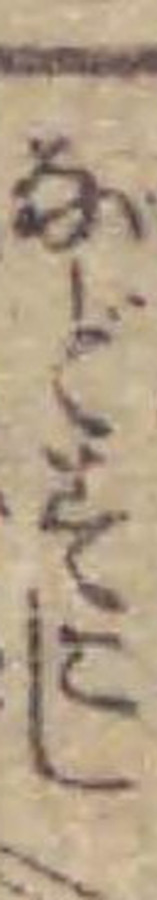などすこし
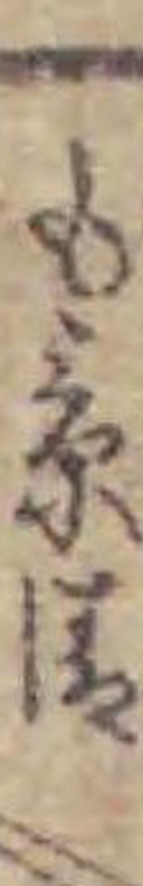も景清
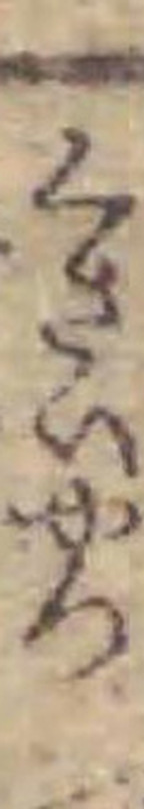くさいやつ
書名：悪七変目景清 : 2巻
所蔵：国立国会図書館 National Diet Library, JAPAN
